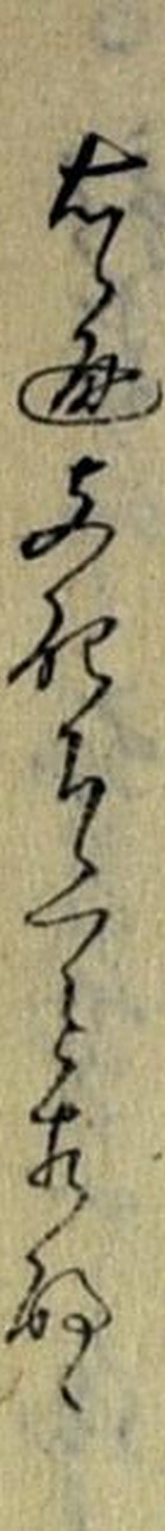右之通支配下へ可被相触候
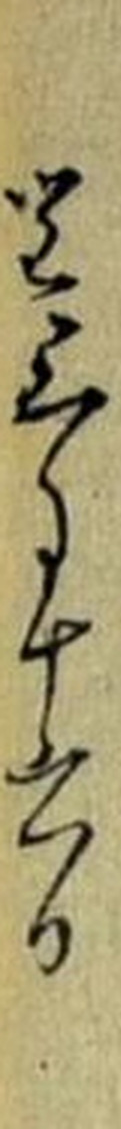閏三月九日
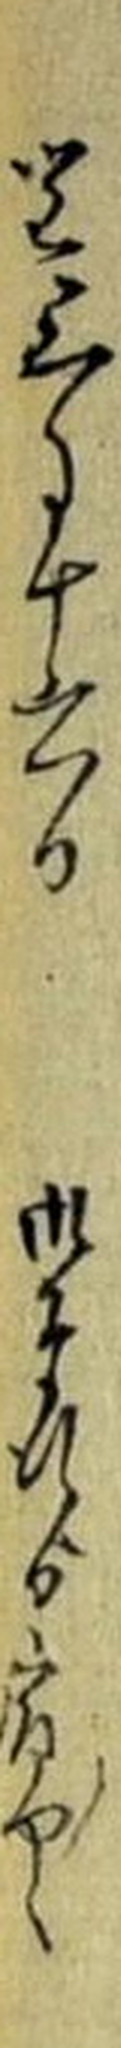閏三月十六日御奉行ゟ府中へ
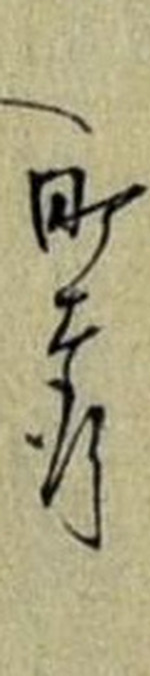町奉行
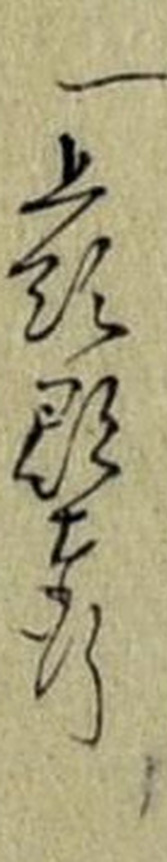上領郡奉行
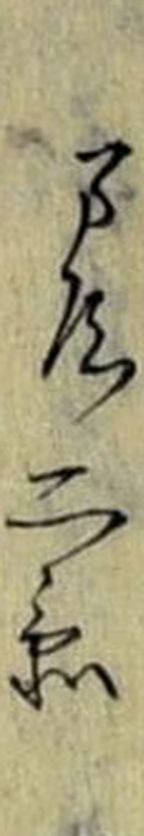万屋二兵衛
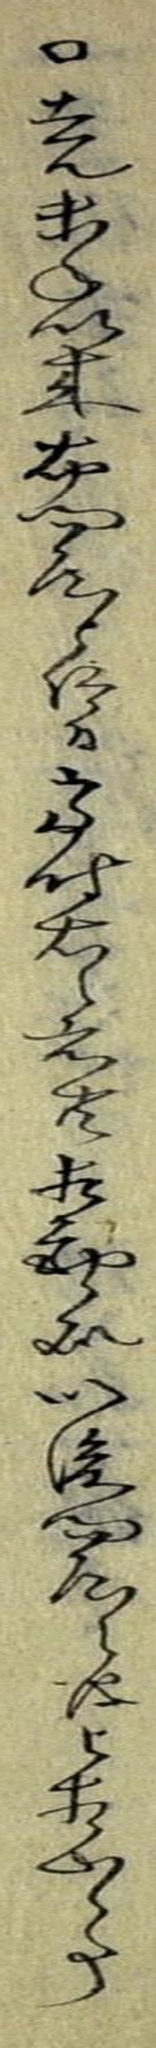○去ル未年以来布問屋被仰付当時右之者共相勤候処以後問屋之儀被相止候事
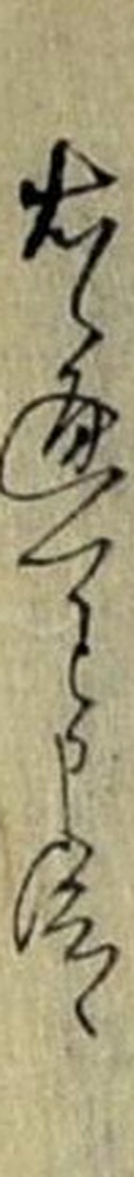右之通可被申渡候
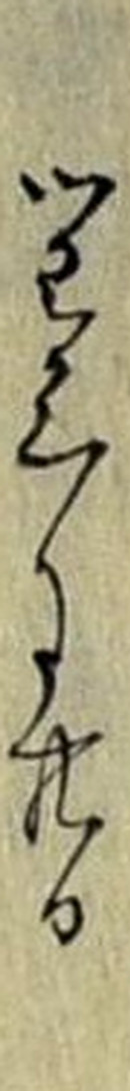閏三月廿日
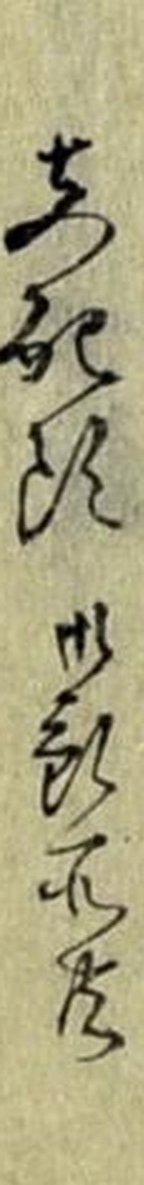支配頭御預所共
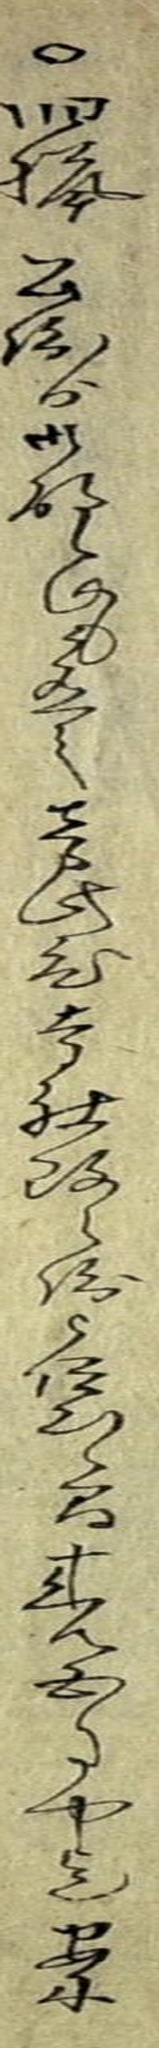○旧臘公儀ゟ御触候趣も有之旁此度寺社改之儀被仰出候間来ル五月中迄案
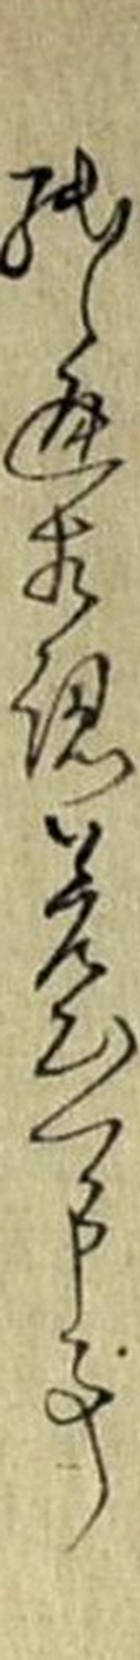紙之通相認差出可申事
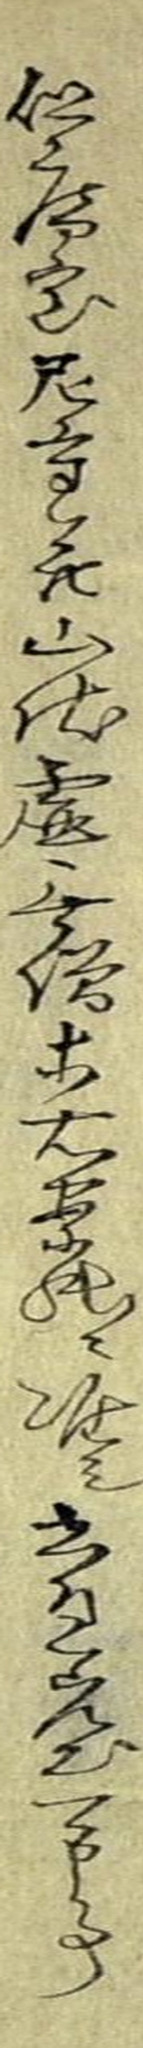但庵室尼寺并山伏虚無僧等右案紙ニ准シ書付差出可申事
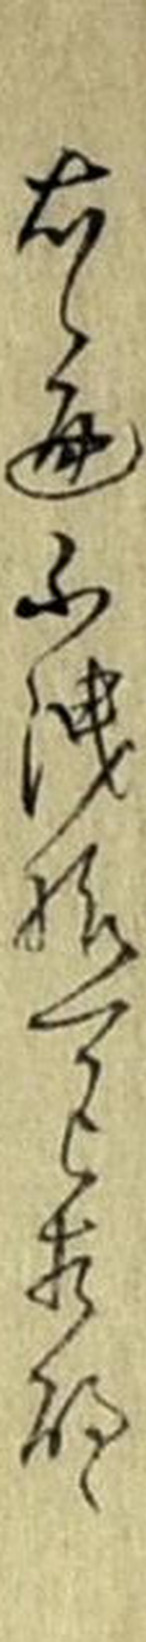右之通不洩様可被相触候

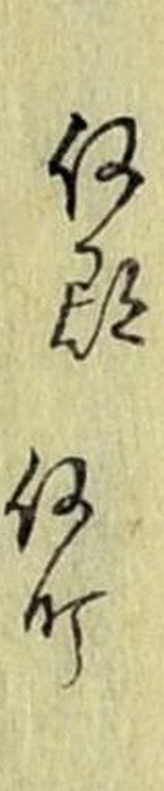何郡何町
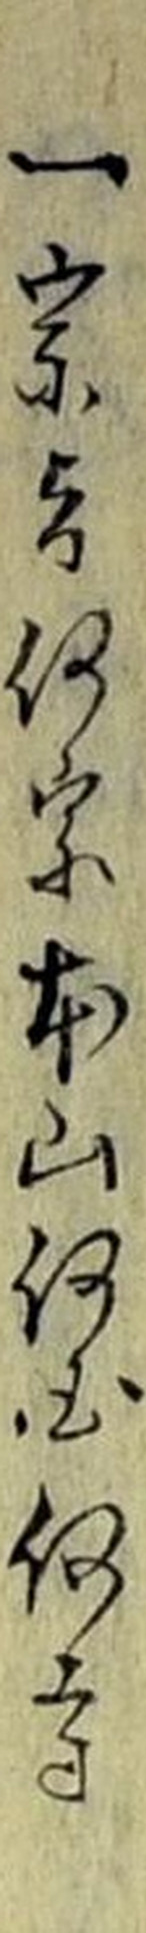一宗旨何宗本山何国何寺
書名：命令之部 五
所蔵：福井県文書館 Fukui Prefectural Archives
